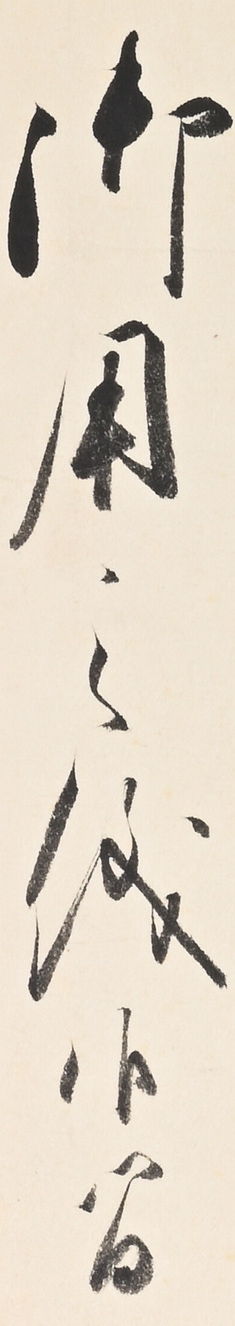御用之儀候間
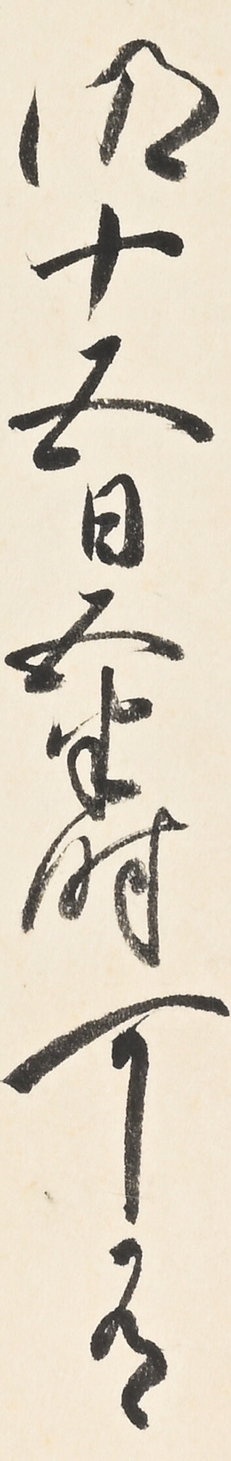明十五日五半時可有
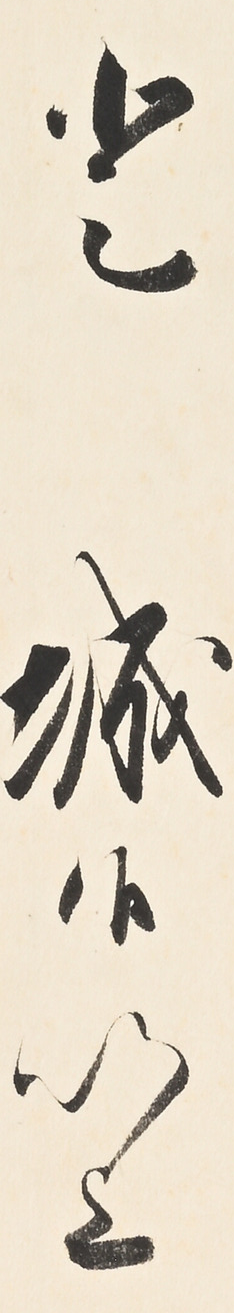登城候以上
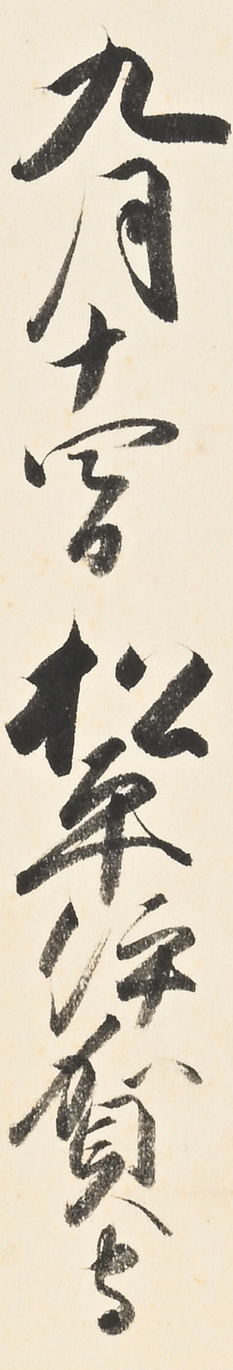九月十四日松平伊賀守
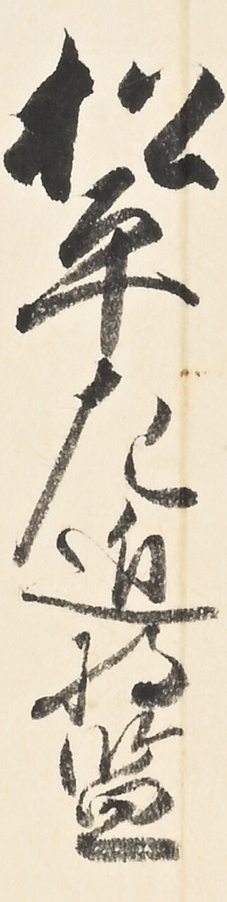松平左近将監
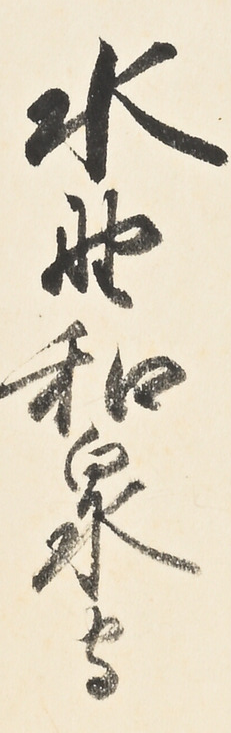水野和泉守
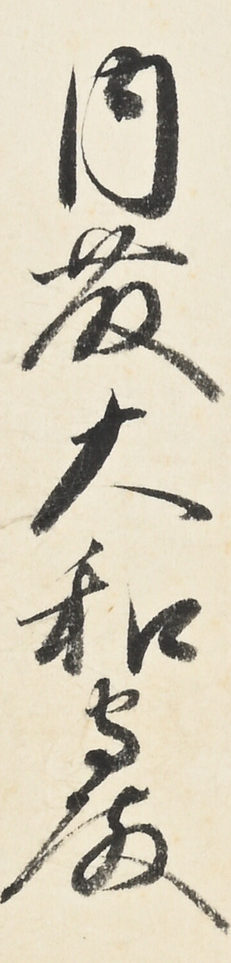内藤大和守殿
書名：（書状）
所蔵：伊那市立高遠町図書館・合同会社AMANE
